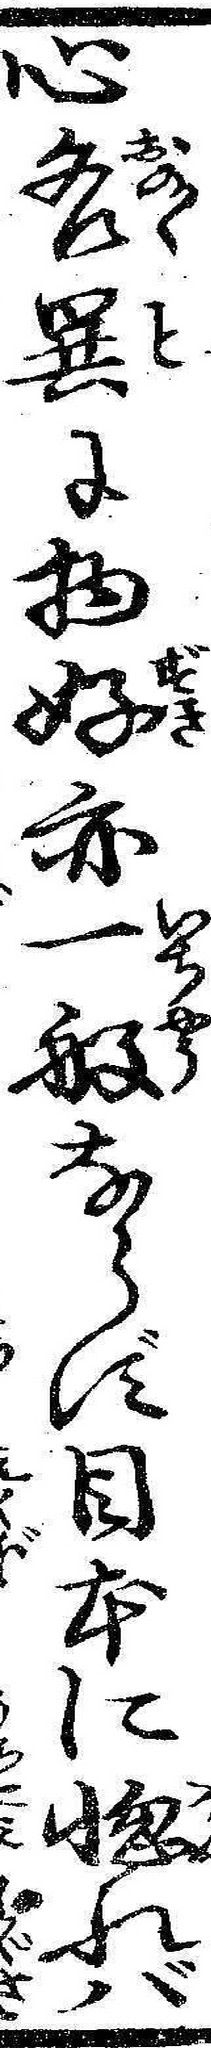心各異に物好亦一般ならず目本に惚れば
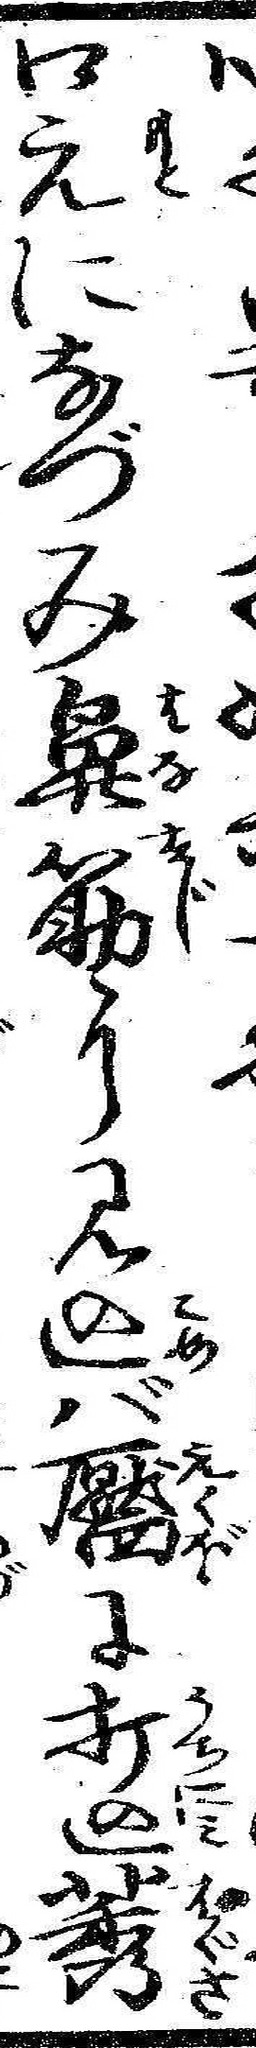口元になづみ鼻筋に見込ば靨に打込莠
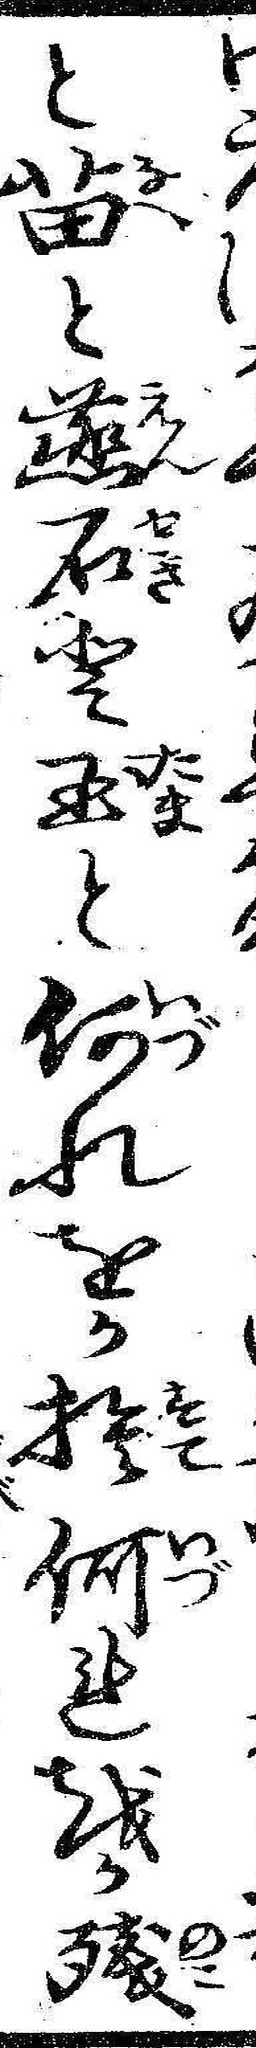と苗と蒸石と玉と何れをか捨何れをか残
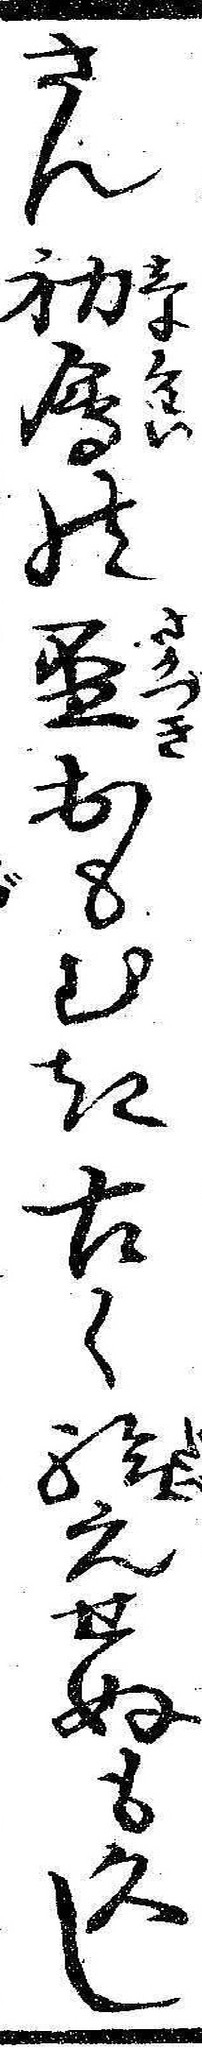さん初会の杯おもむき古く給えせぬも久し
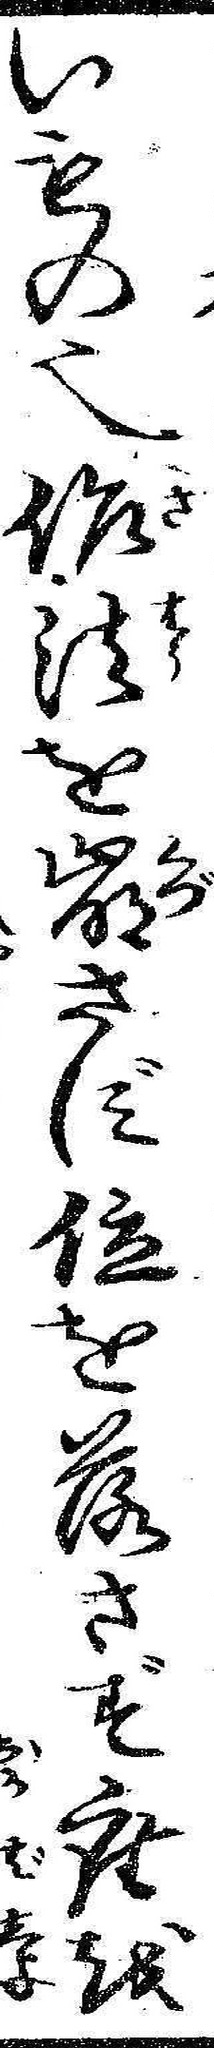いもの也作法を崩さず位を落さず座を
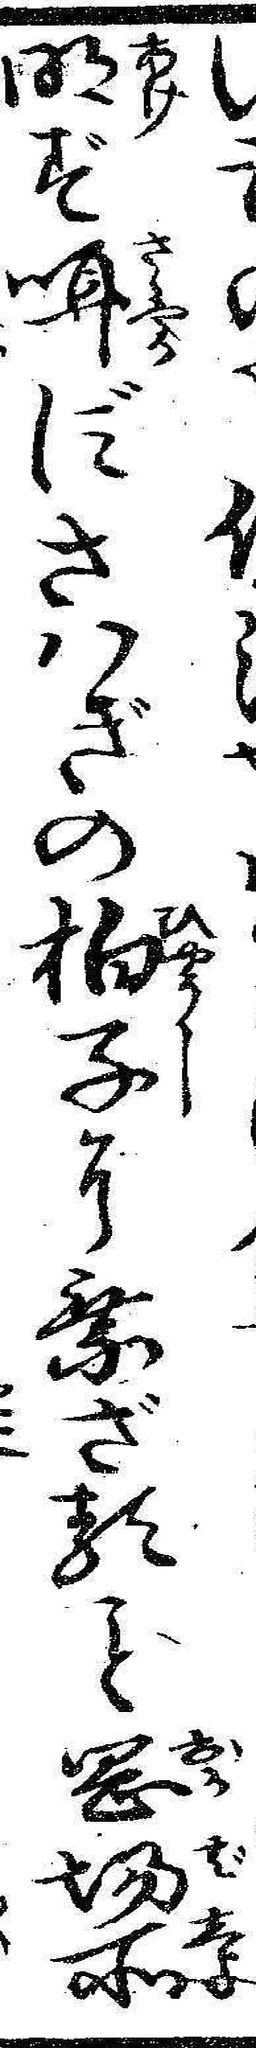明ず囁ずさはぎの柏子に乗ざること岡場所
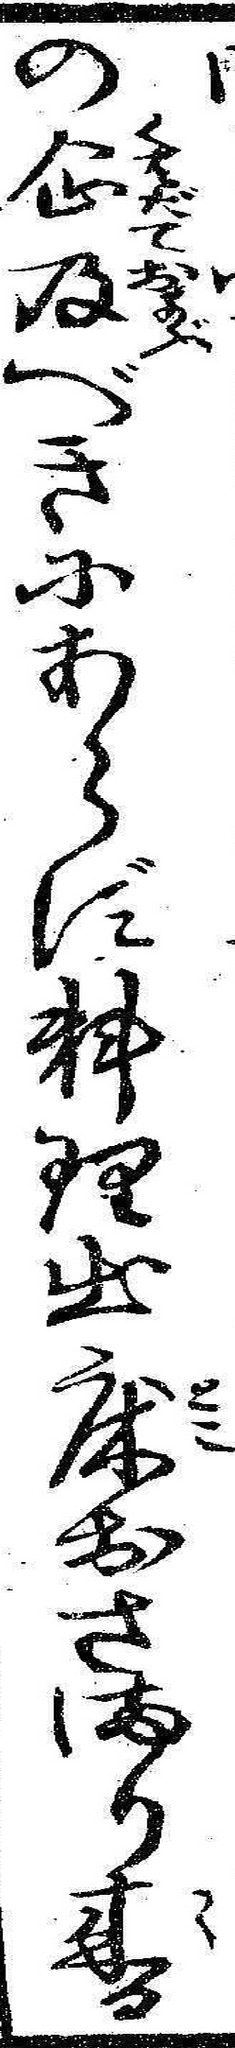の企及べきにあらず料理出床おさまり来る

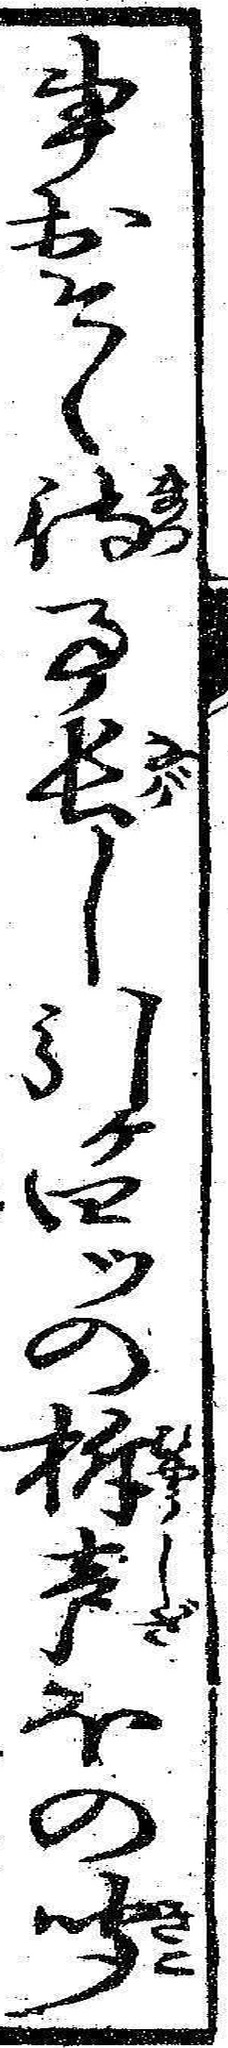事おそく待事長し引四折声ほの聞
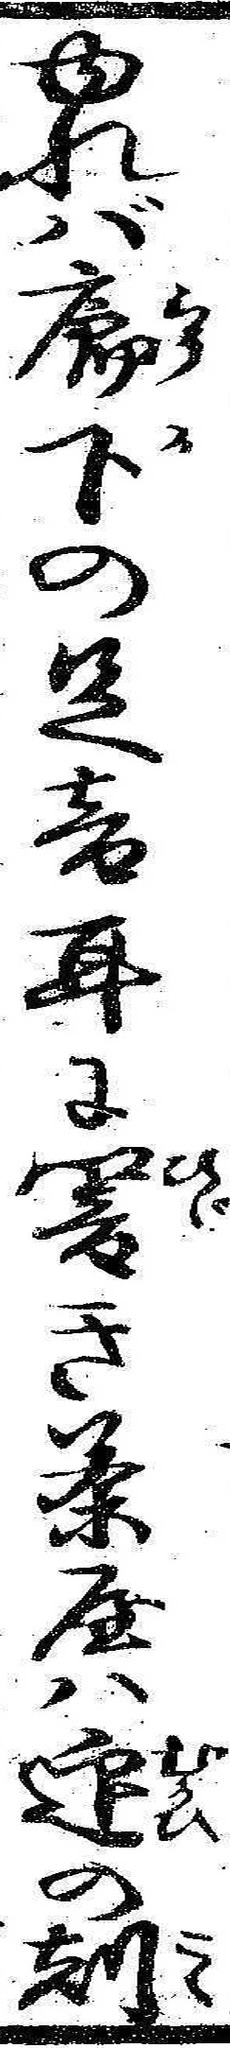ゆれば廊下の足音耳に響き茶屋は迎の刻
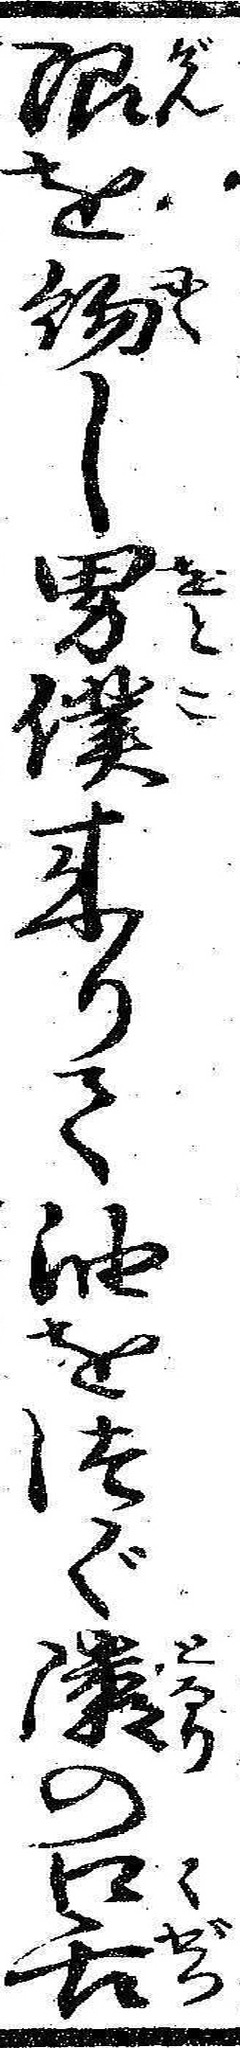限を約し男僕来りて油をつぐ隣の口舌
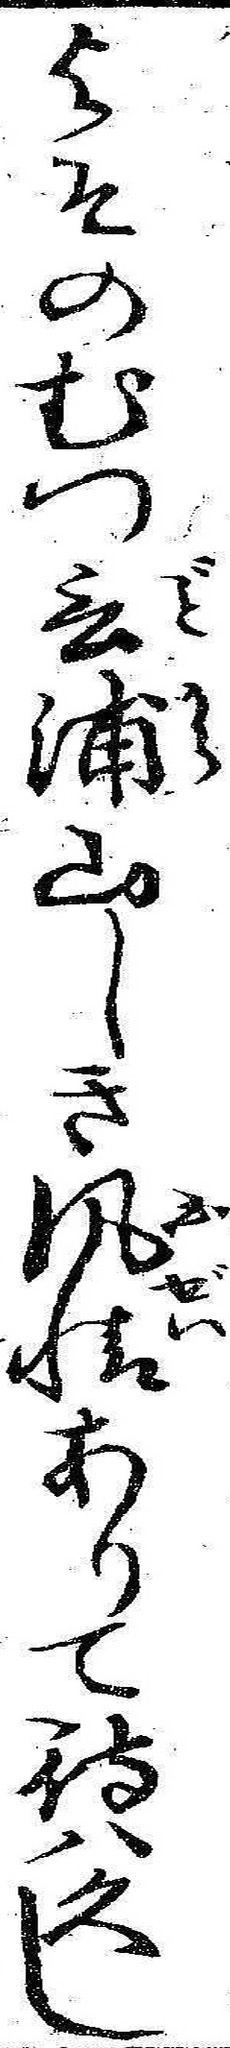よそのむつ言浦山しき風情ありて待は久し
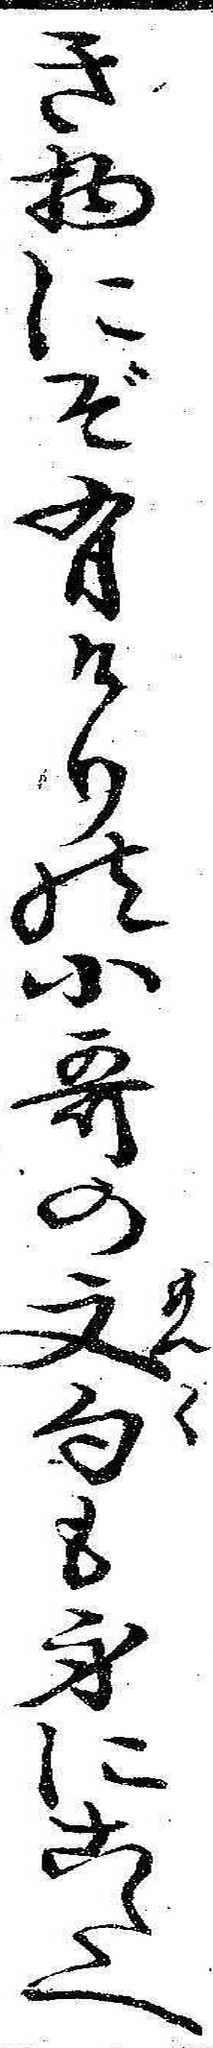き物にぞ有けりの小哥の文句も身にこたへ
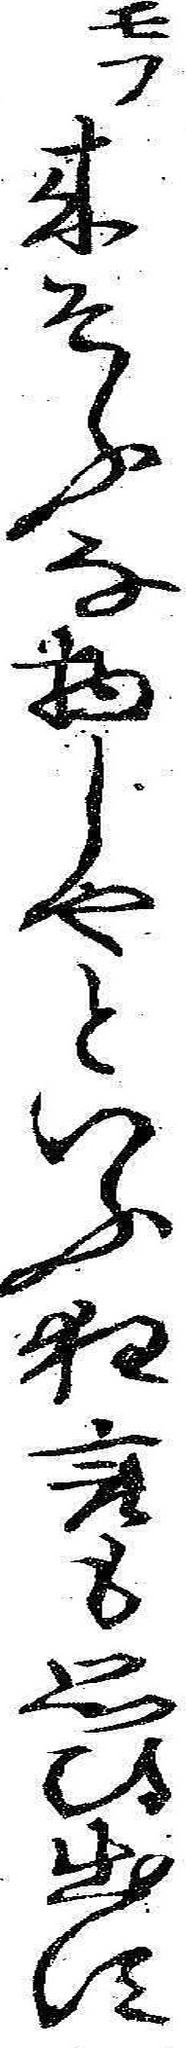来そふな物しやといふ狂言も思ひ出す
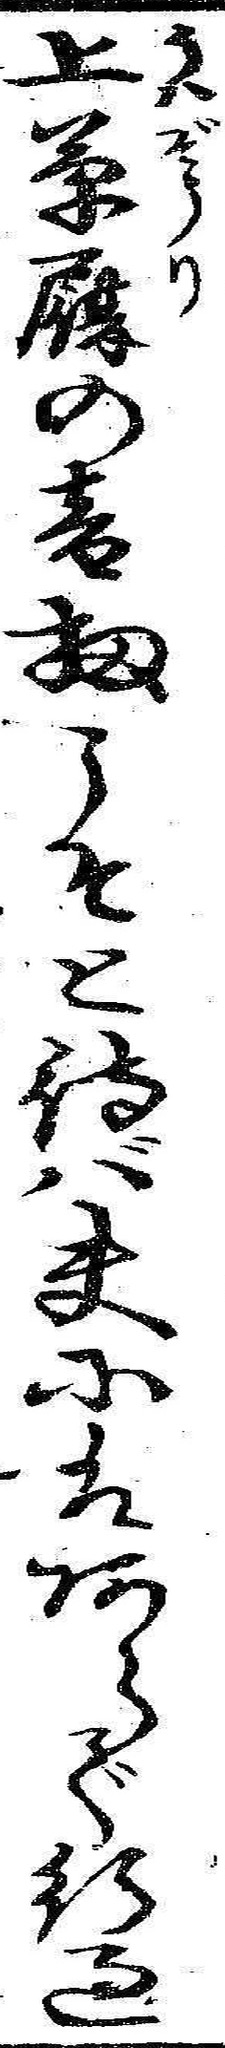上草履の音扨こそと待ば夫にはあらで行過
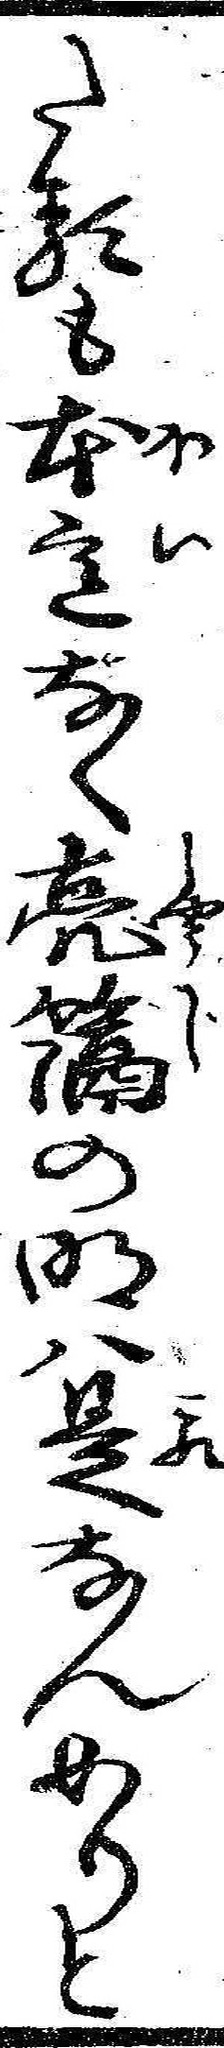たるも本意なく亮隔の明は是なんめりと
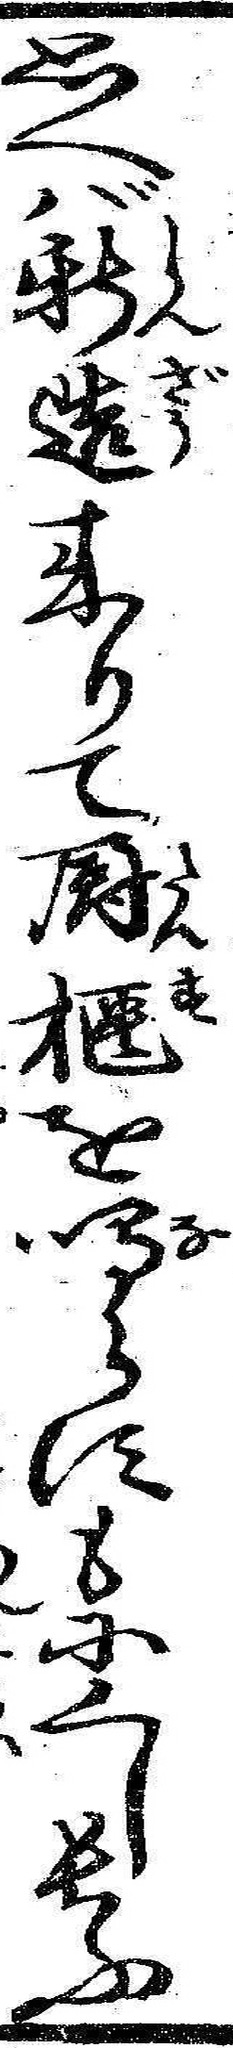思へば新造来りて厨櫃を鳴らすもにくし長ふ
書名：根無草後編
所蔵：国文学研究資料館
